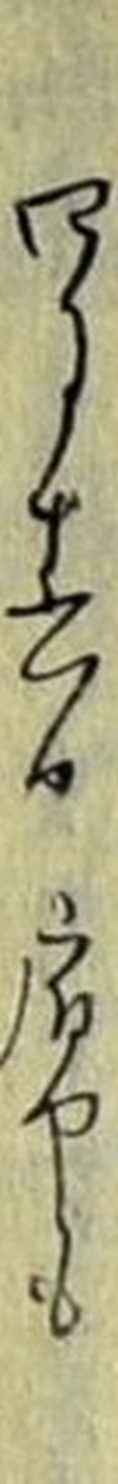四月十六日府中も

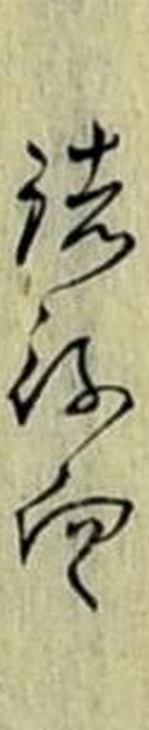諸役向へ
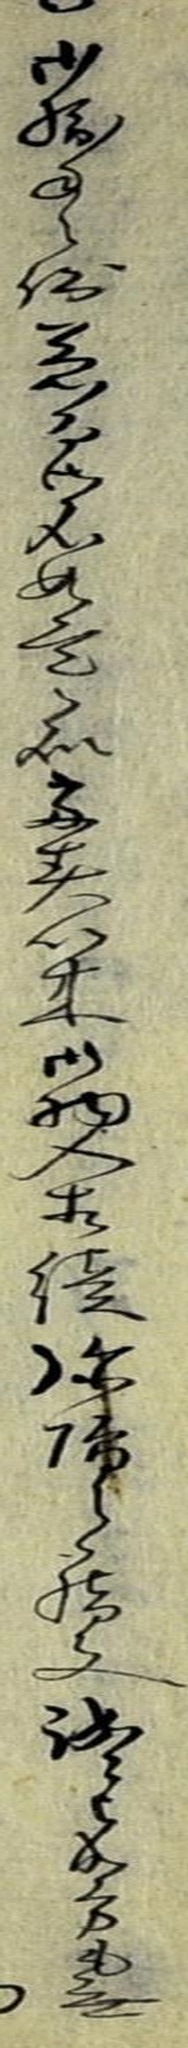〇御勝手之儀兼而御不如意之処当春以来御物入相続弥増之御指支誠に被成方も無
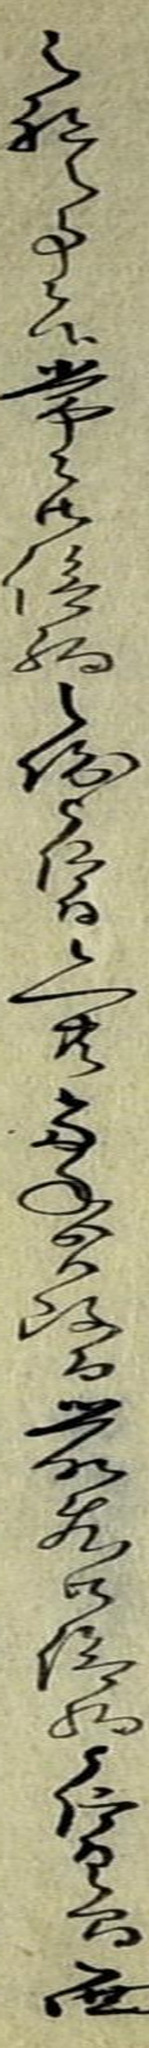之程之事に候常々御倹約之儀被仰付候へ共当年ゟは改而厳敷御倹約被仰付候間面
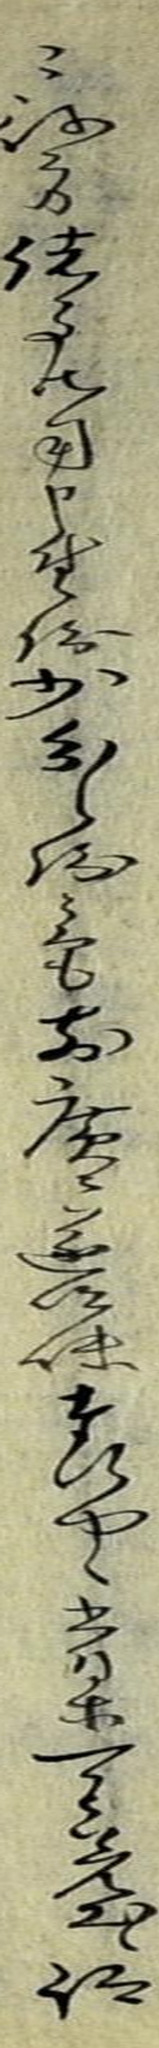々役方諸事御用申付候儀少分之儀に而も前広に遂吟味奉行中へ書付等可被差出候跡
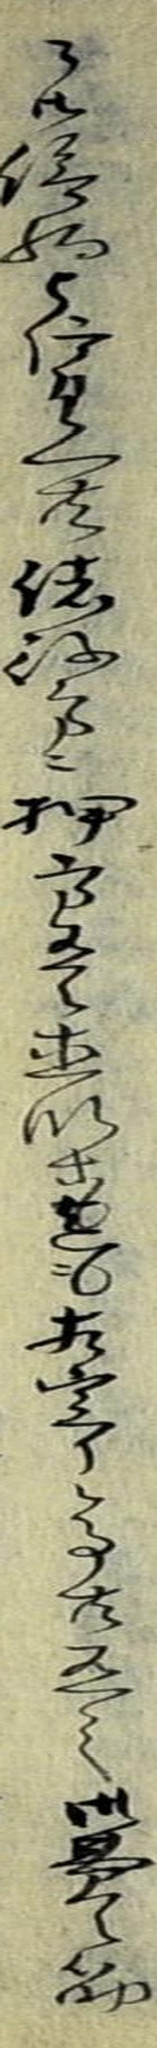々御倹約被仰付候へ共諸役方に押方有之直段等迄も相定り候事共有之御費之筋
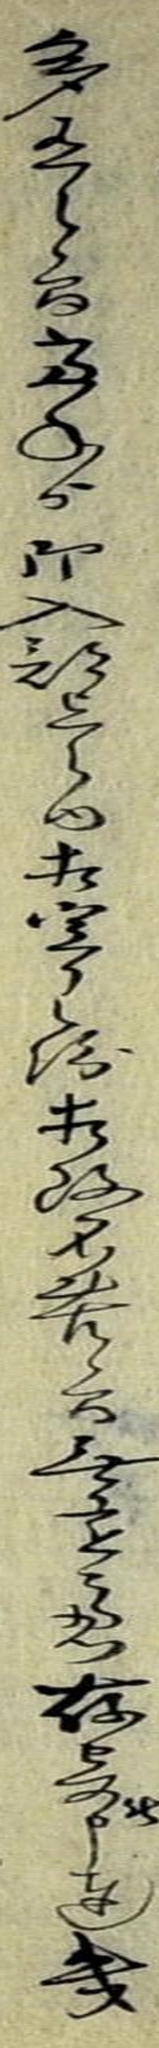多有之候間当年ゟ御入部迄之内相定り之儀相改不苦候間無遠慮存寄被申達幾
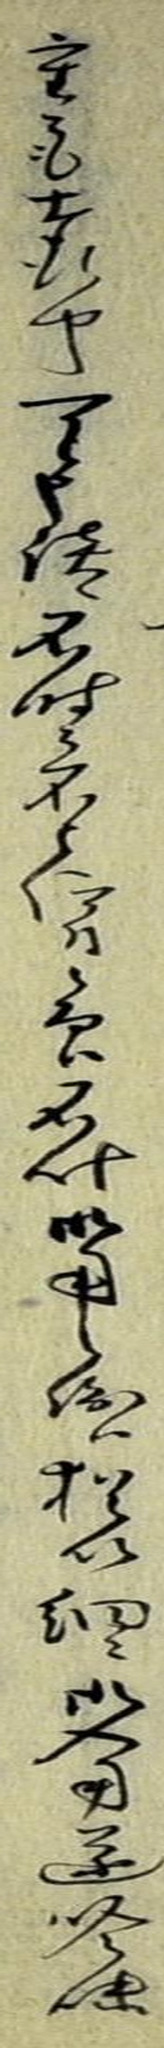重にも奉行中可被申談候不時に不被仰付候而は不叶御用之儀は猶以細々御入用遂吟味
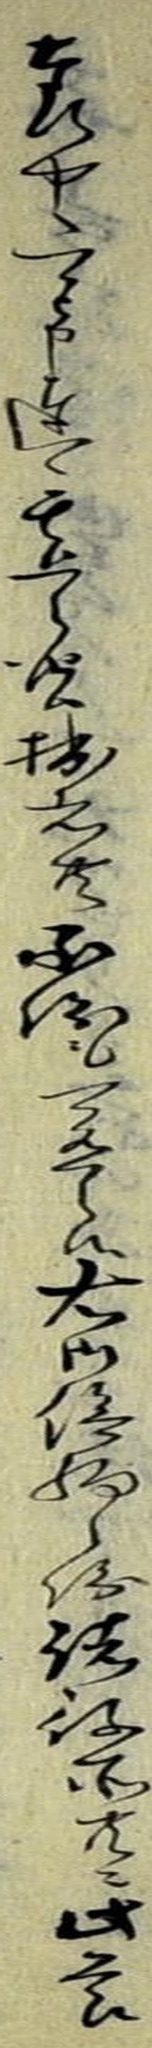奉行中へ可被申達候其上之儀は拙者共承儀も可有之候右吾倹約之儀諸役所共に此節
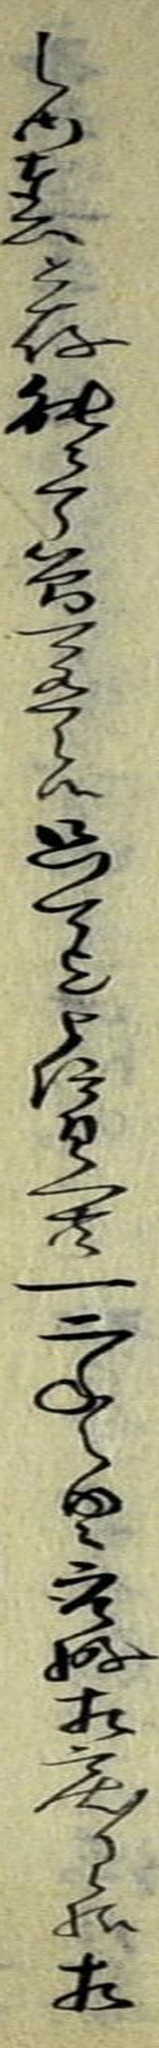之御奉公と存能々了簡可有之候只今迄被仰付候へ共一二年之内に取扱相戻り候様相
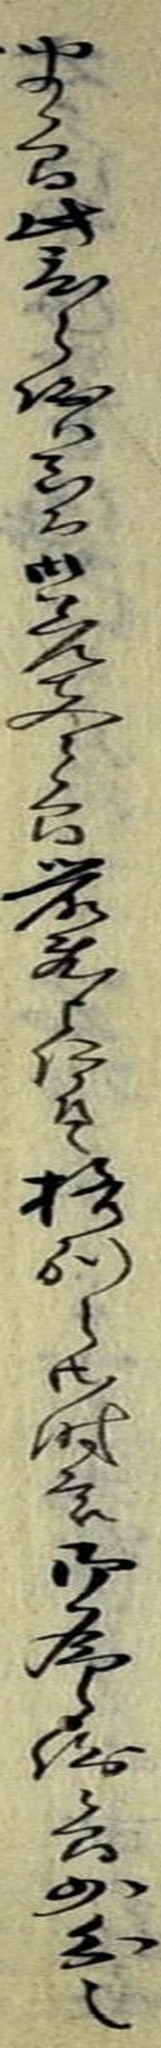聞候間此度之儀は至而御差支に候間厳敷被仰付候格別之御時節御為之儀候間少分之
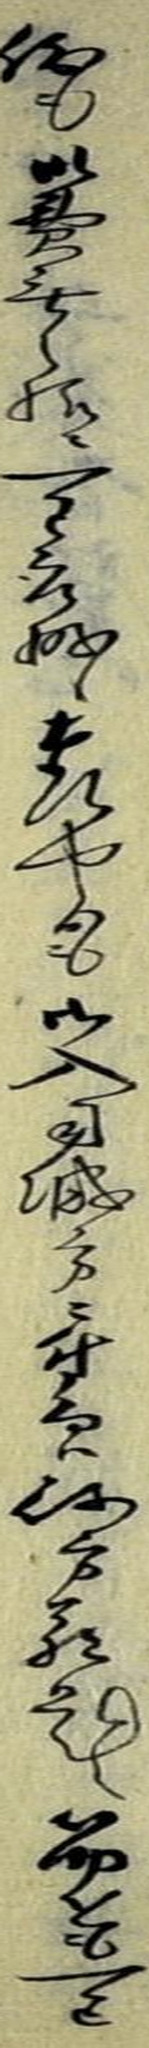儀も御費無之様に可被取扱候奉行中ゟも御入用減方に付而は役方難題之筋とも可被
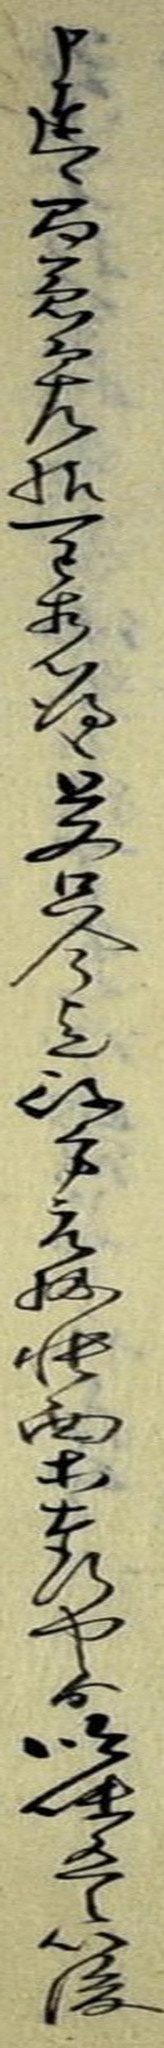申達候間兼而左様可被相心得候且又只今迄役方取扱帳面等奉行中ゟ吟味有之以後
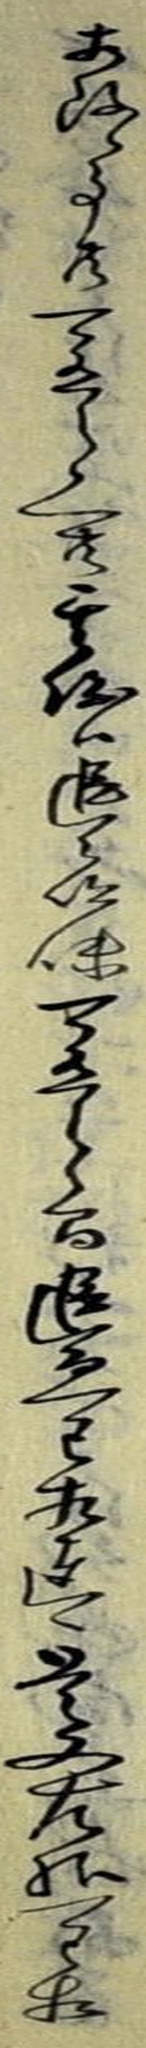相改候事共可有之候へ共其儀は追々吟味可有之候間追而可被相達候是又左様可被相心得候
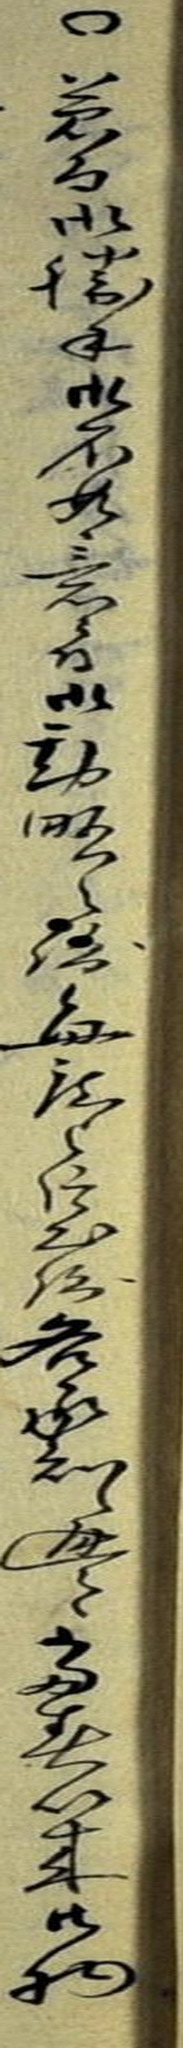〇兼而御勝手御不如意に付御勘略之儀毎度被仰出儀各承知之通に候当春以来御物
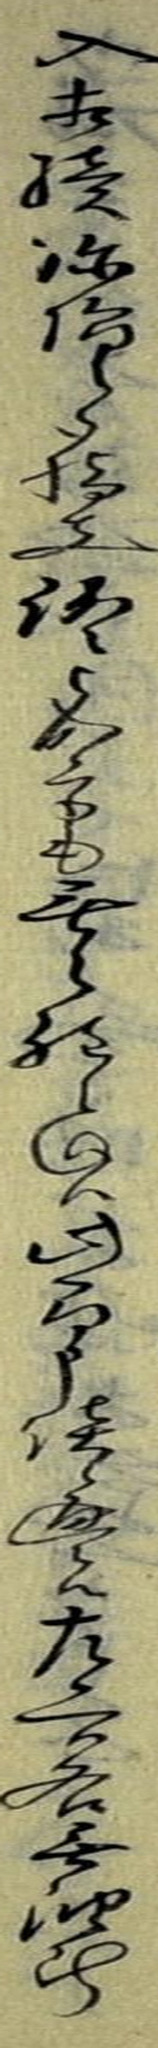入相続医弥増之御指支誠に被成方も無之程之趣は此間申談候通に候左候へは各無油断
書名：命令之部 二
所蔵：福井県文書館 Fukui Prefectural Archives
